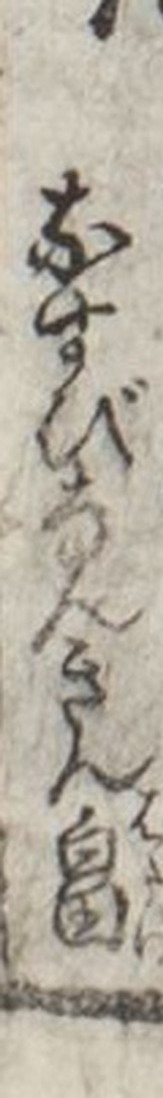なすびなんきん畠
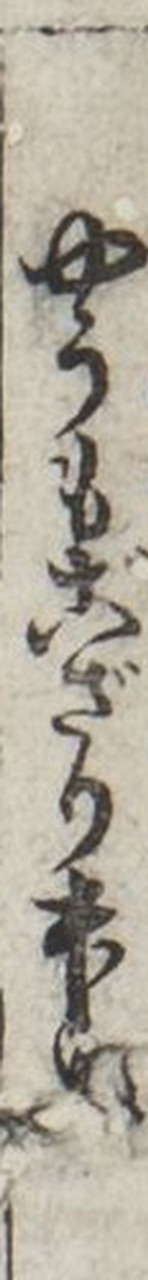やうもござり升がへ
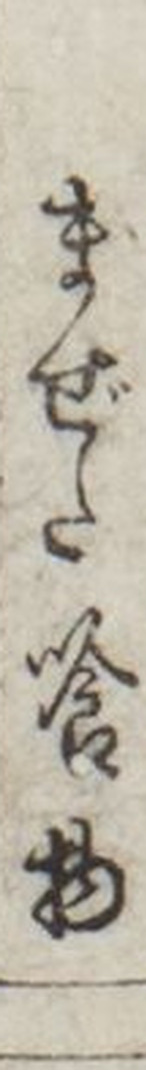まぜた喰物
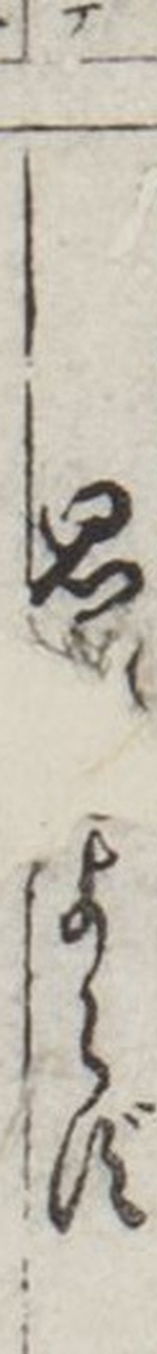思よらず
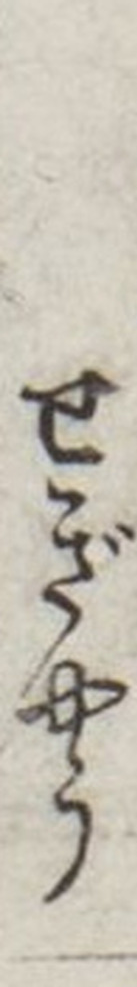せぎやう
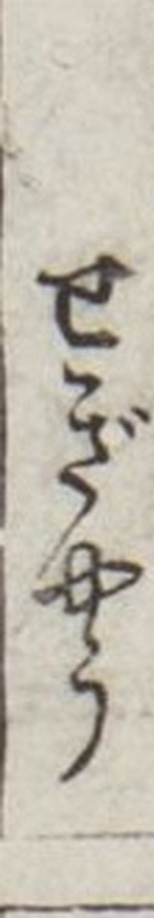せぎやう
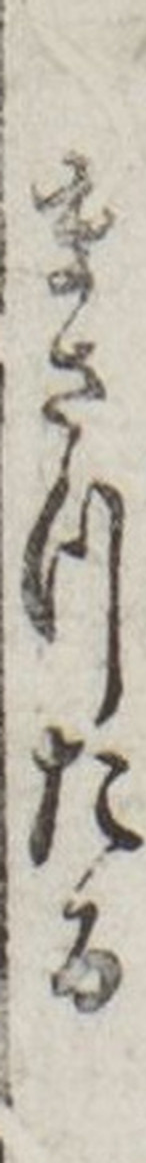まさつたる
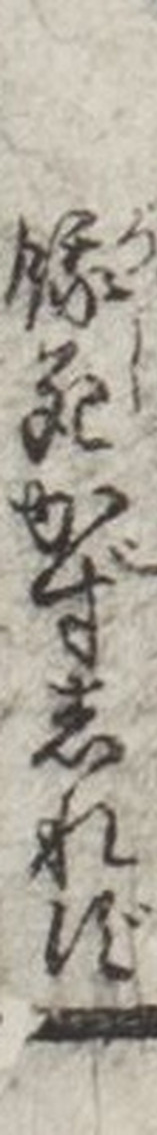餓死かずしれず
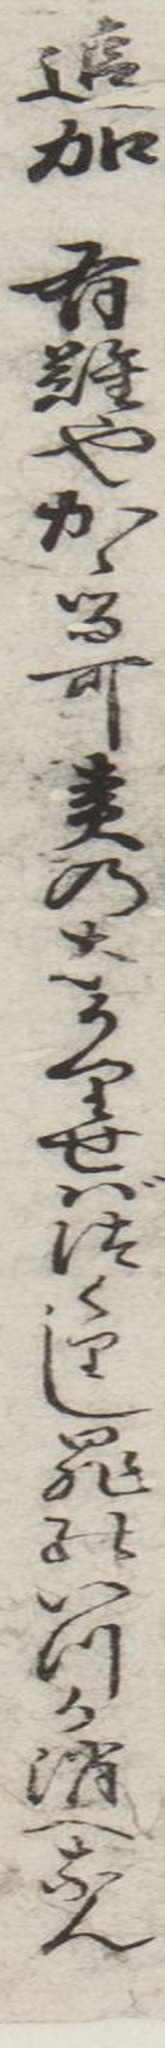追加有難やかゝる可美のなかりせばつくりし罪のいつか消へなん
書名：忘れまい沼津見立
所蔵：あいおいニッセイ同和損保株式会社
